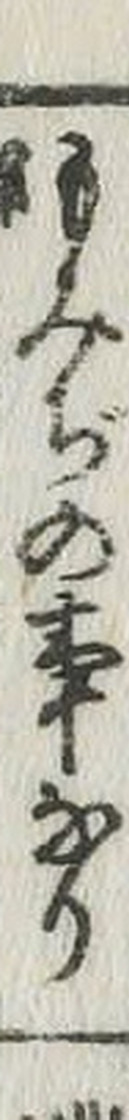もみぢの事なり
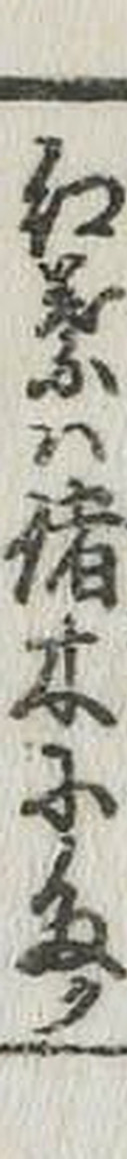補紅葉は諸木に多ク

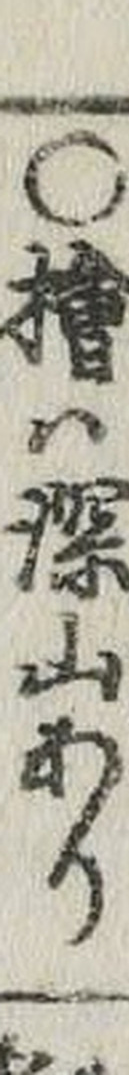○檜は深山あり
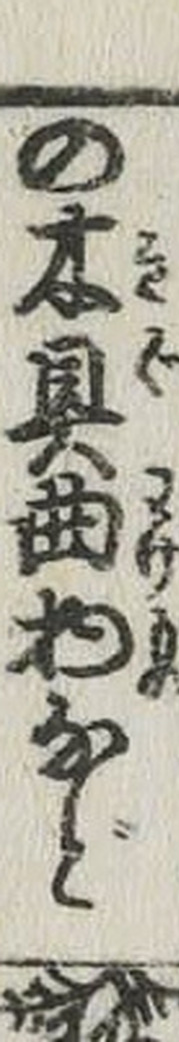の木具曲物など
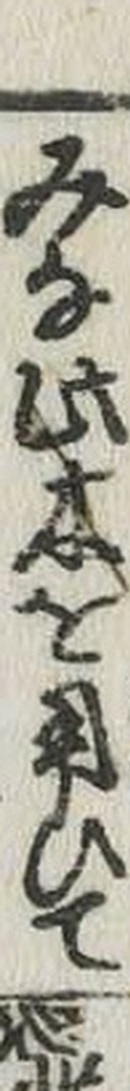みな此木を用ひて
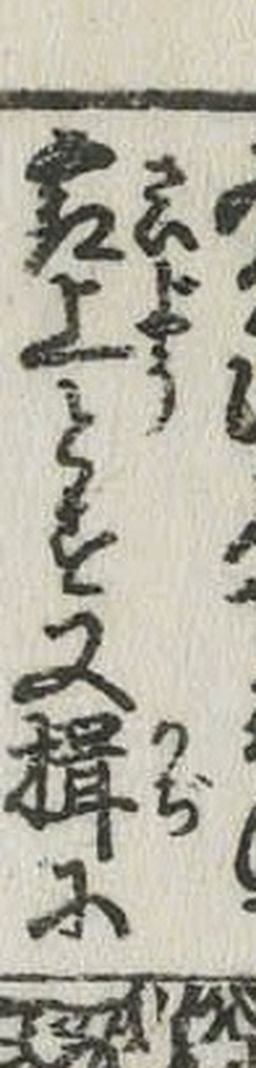最上とす又楫に
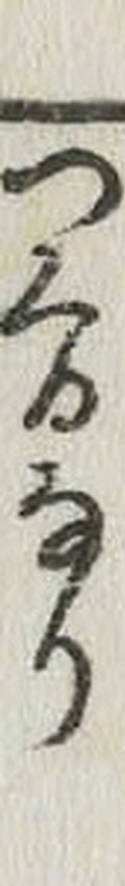つくるなり
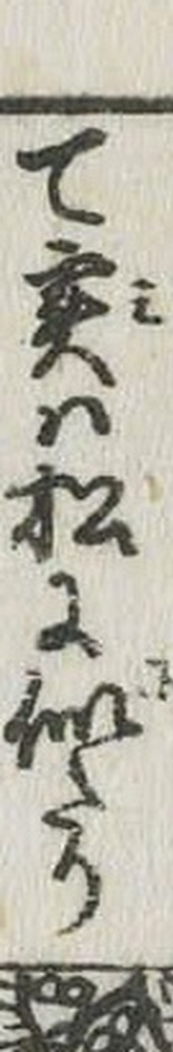て実は松に似たり
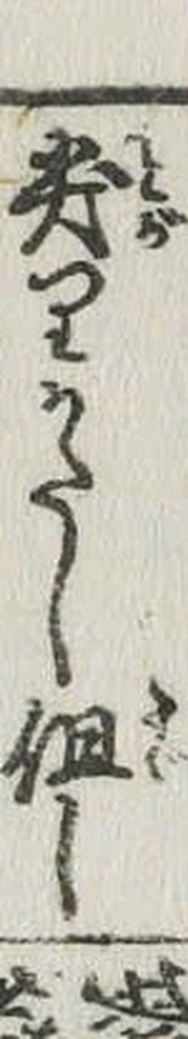尖りかたし但し
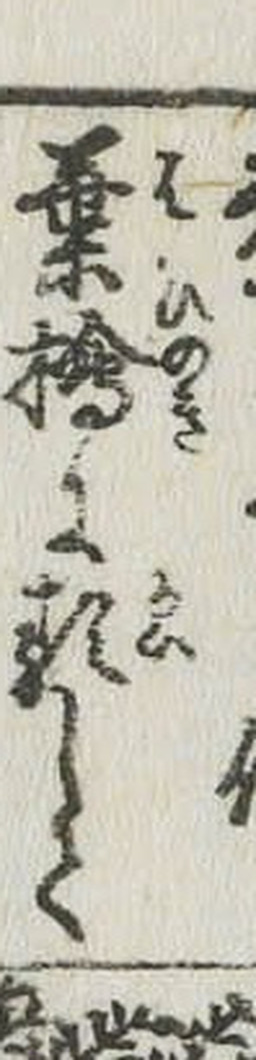葉檜に類して
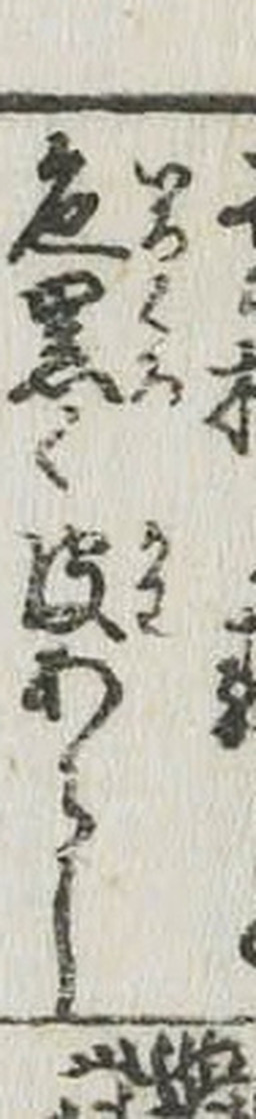色黒く皮あらし
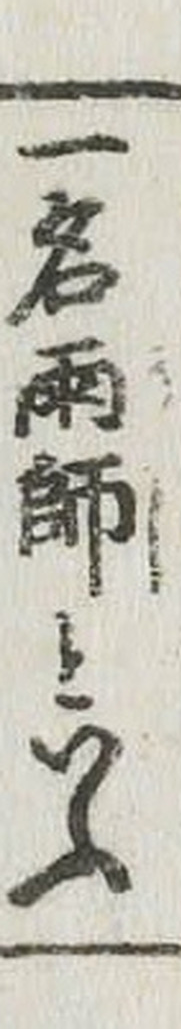一名雨師といふ
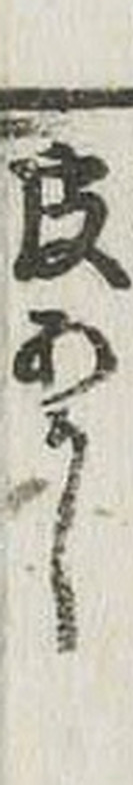皮あらし
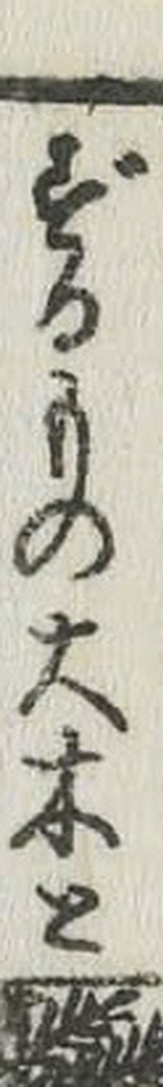ずるもの大木と
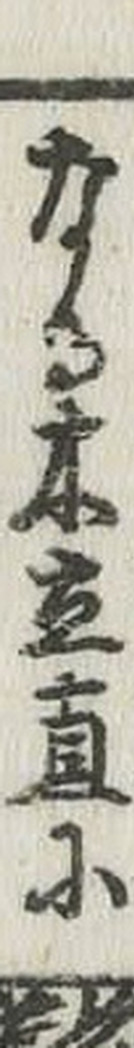なる木立直に
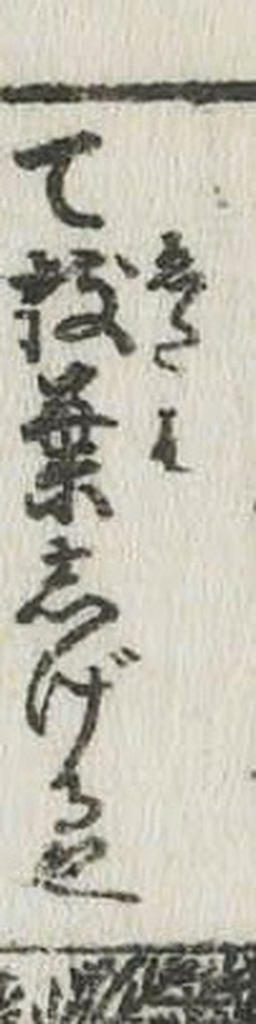て枝葉しげる也
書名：増補頭書訓蒙図彙大成 10巻 8:巻之17-19
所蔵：東京学芸大学教育コンテンツアーカイブ
